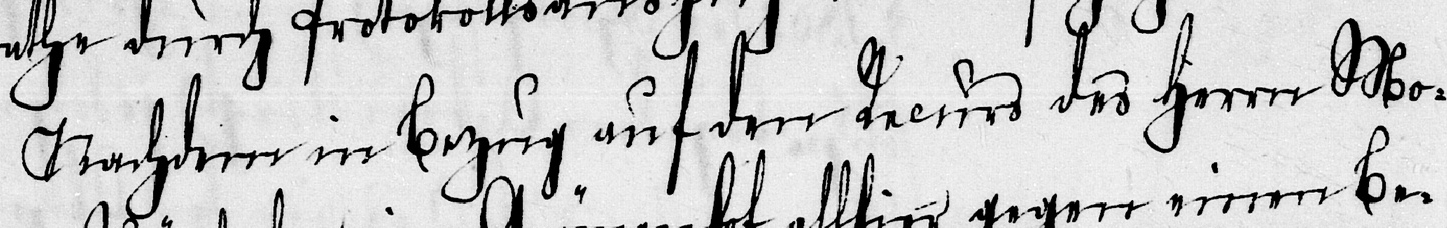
Nachdem in Bezug auf den Recurs des Herrn Mo¬
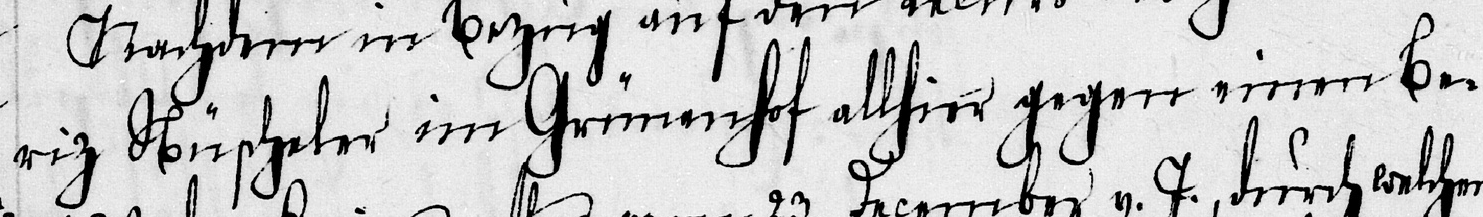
riz Nüscheler im Grünenhof allhier gegen einen Be¬
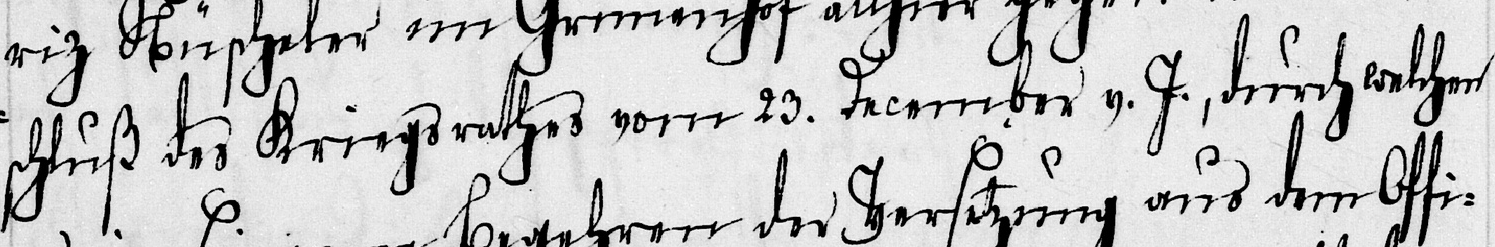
schluß des Kriegsrathes vom 23. December v. J., durch welchen
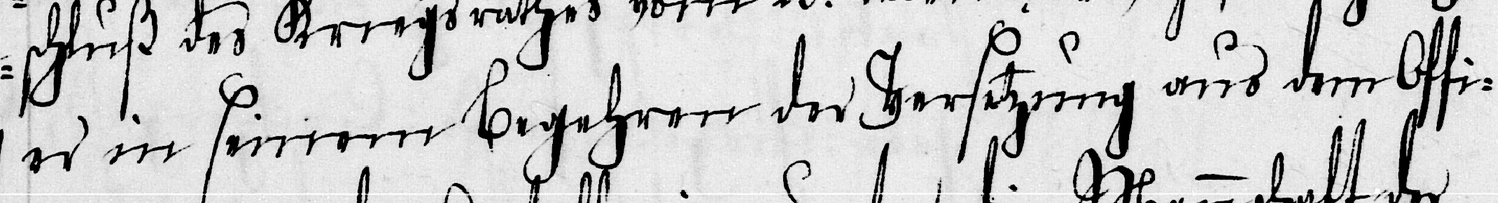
er in seinem Begehren der Versetzung aus dem Offi¬
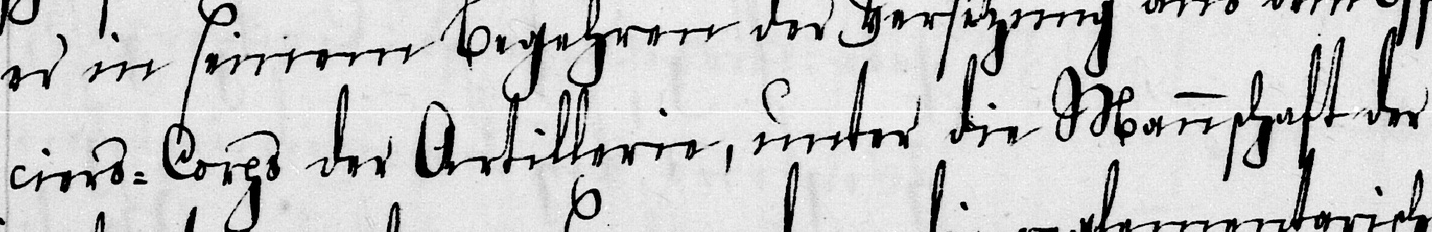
ciers-Corps der Artillerie, unter die Mannschaft der
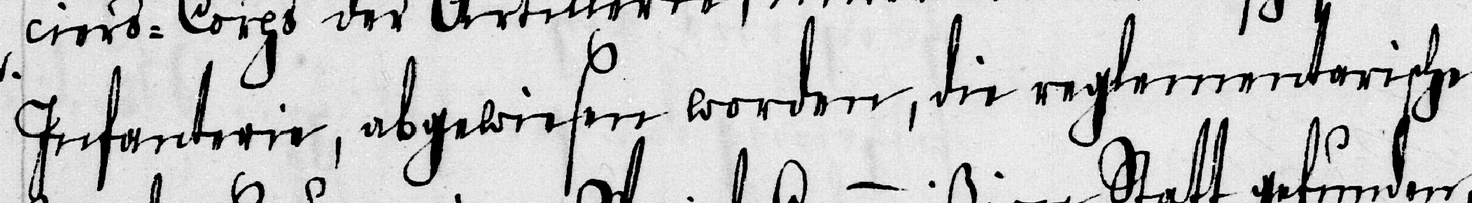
Infanterie, abgewiesen worden, die reglementarische
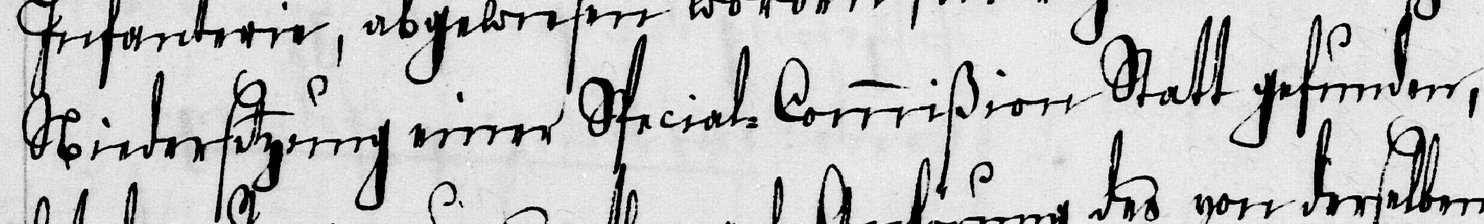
Niedersetzung einer Special-Commißion Statt gefunden,
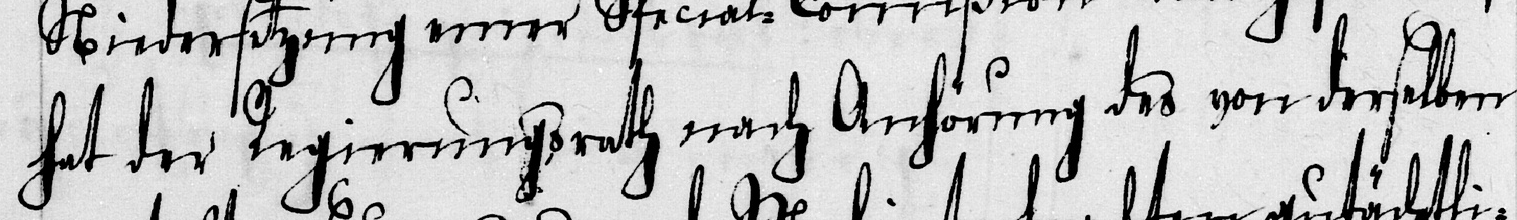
hat der Regierungsrath nach Anhörung des von derselben
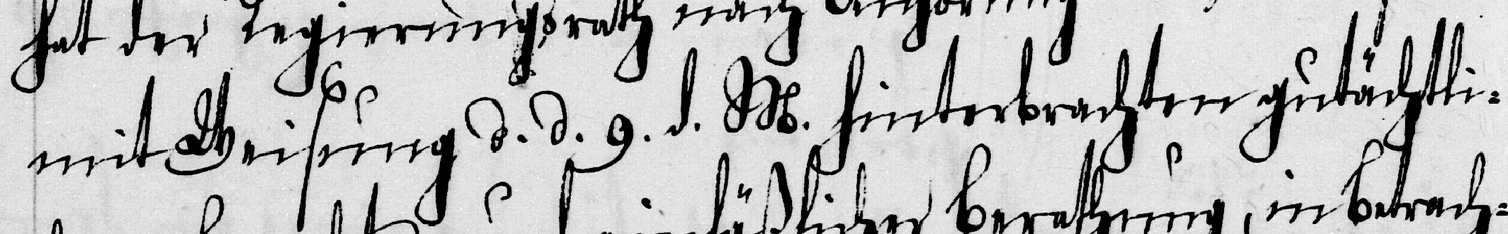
mit Weisung d. d. 9. d. M. hinterbrachten gutächtli¬
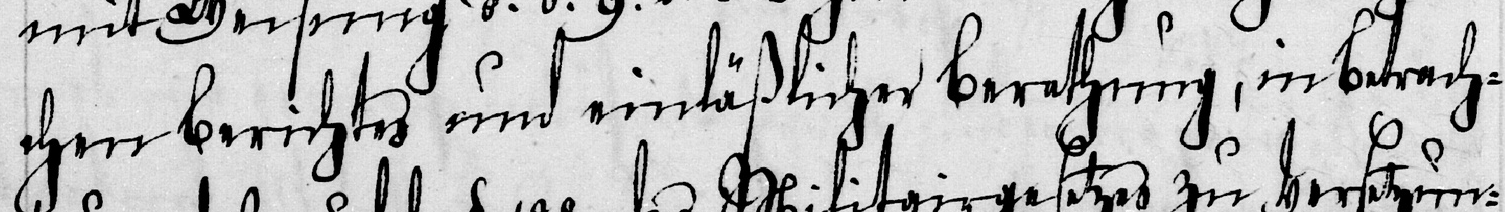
chen Berichtes und einläßlicher Berathung, in Betrach¬
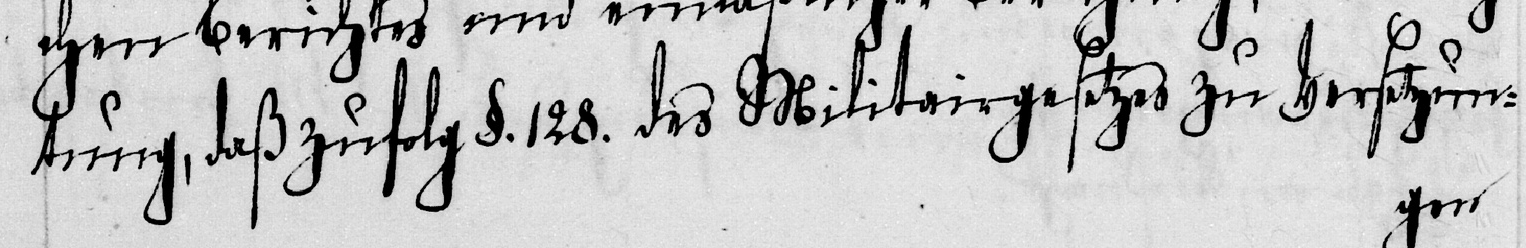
tung, daß zufolg §. 128. des Militairgesetzes zu Versetzun-
